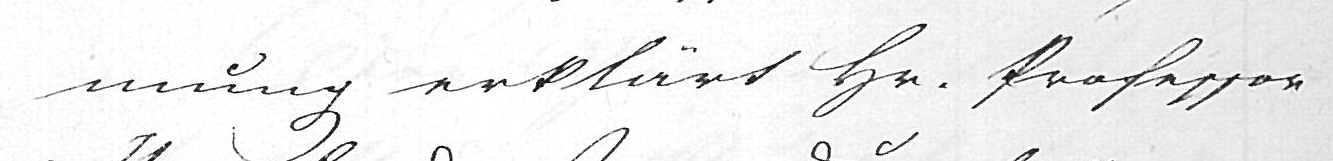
mung erklärt Hr. Professor
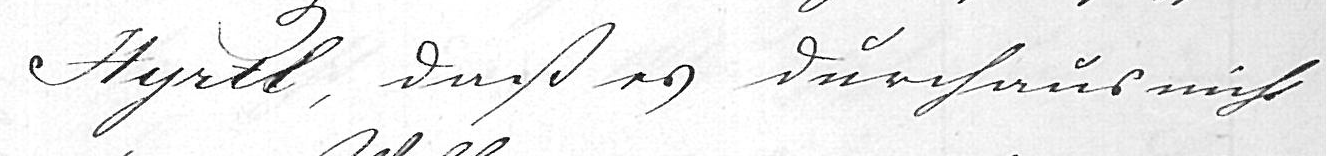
Hyrtl, daß es durchaus nicht
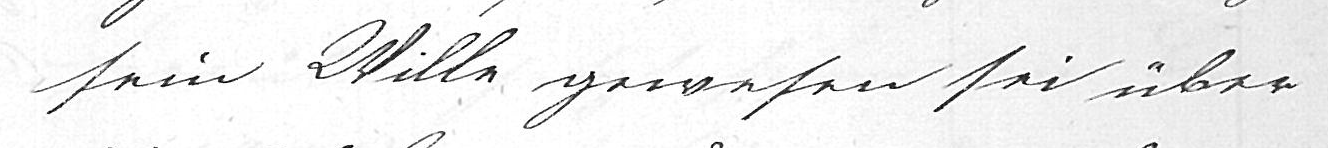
sein Wille gewesen sei über
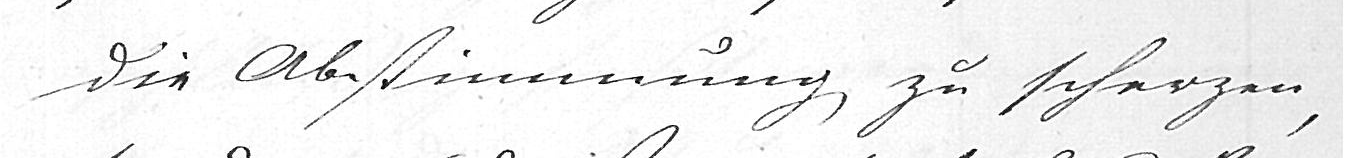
die Abstimmung zu scherzen,
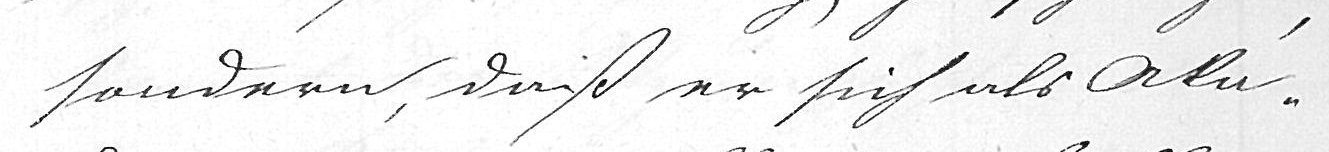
sondern, daß er sich als Aka-
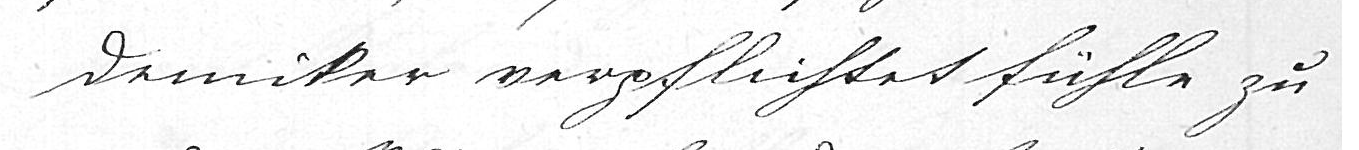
demiker verpflichtet fühle zu
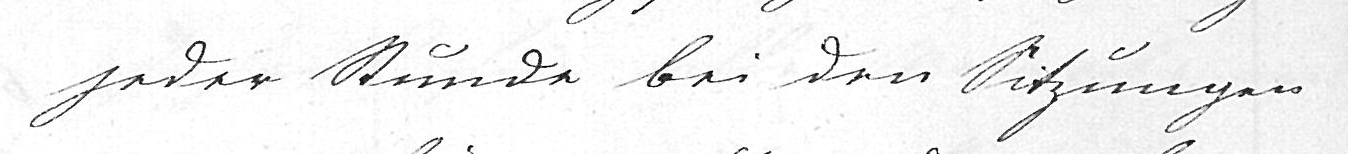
jeder Stunde bei den Sitzungen
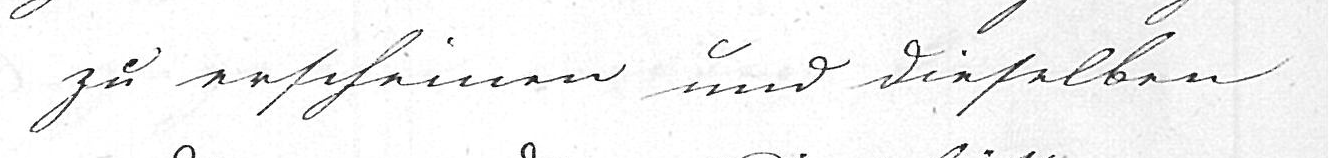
zu erscheinen und dieselben
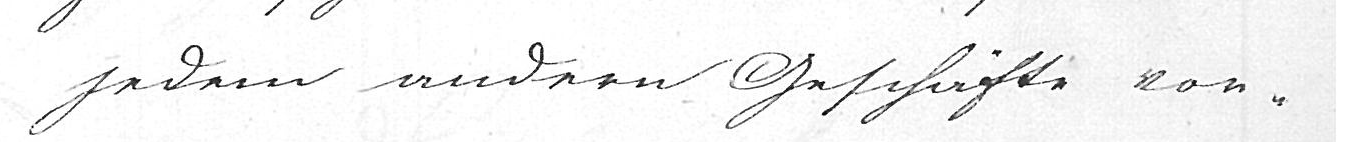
jedem andern Geschäfte vor-
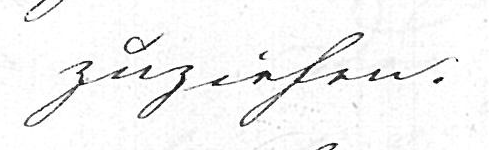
zuziehen.
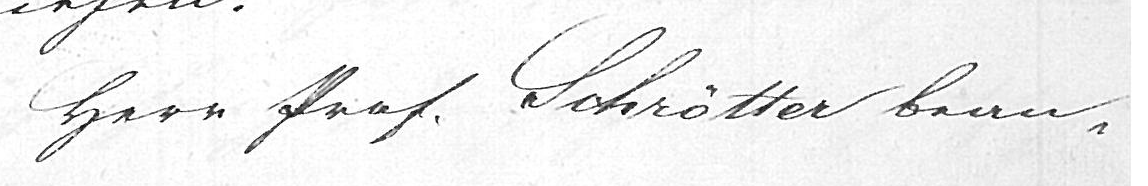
Herr Prof. Schrötter bean-
